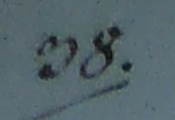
38.
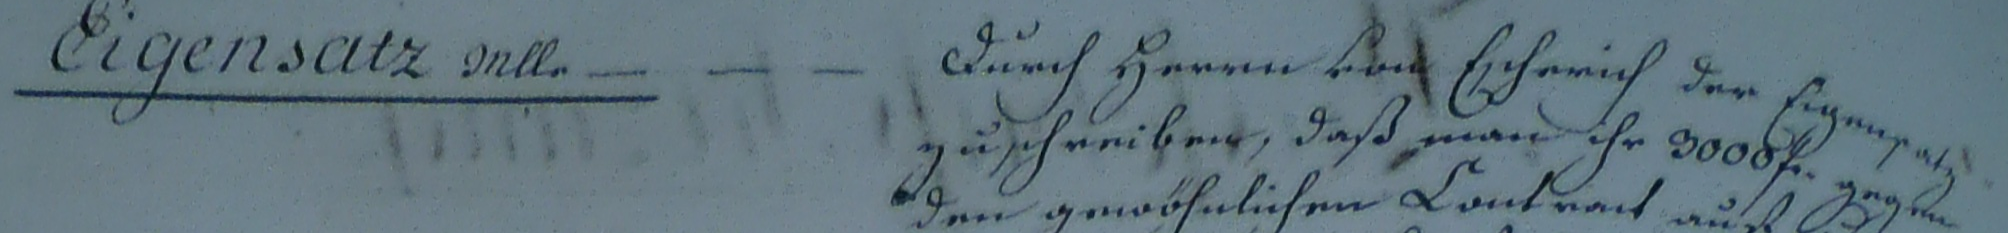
Eigensatz Mlle _ _ _ Durch Herrn von Escherich der Eigensatz
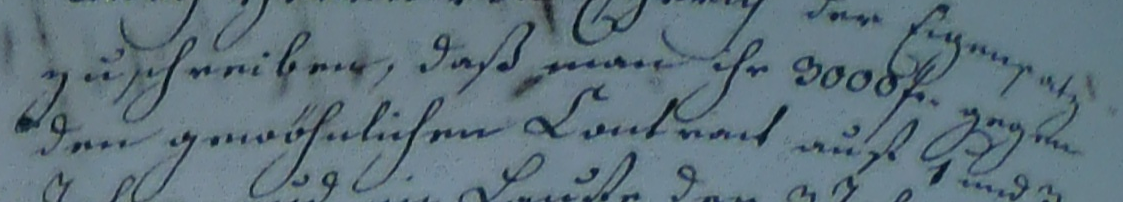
zuschreiben, daß man ihr 3000fr. gegen
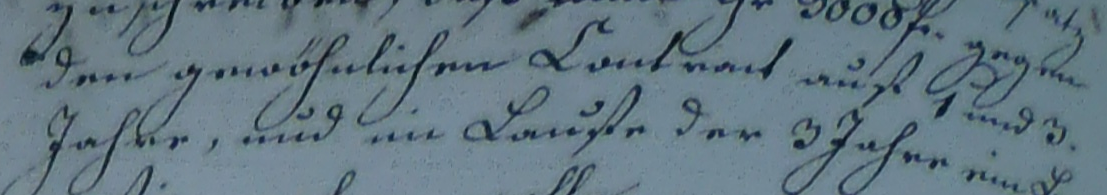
den gewöhnlichen Contract auf 1 und 3.
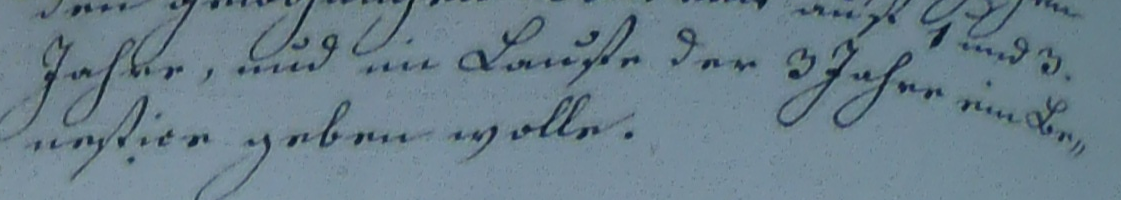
Jahre, und im Laufe der 3 Jahre ein Be¬
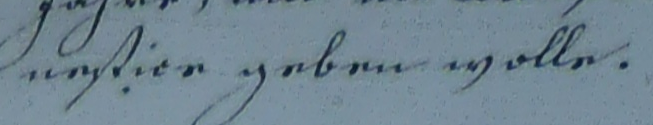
nefice geben wolle.
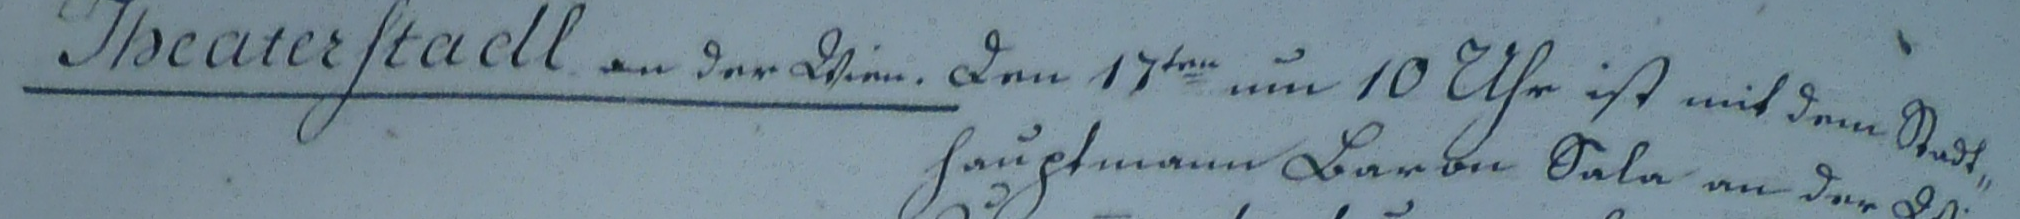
Theaterstadl an der Wien. Den 17te͇n um 10 Uhr ist mit dem Stadt¬
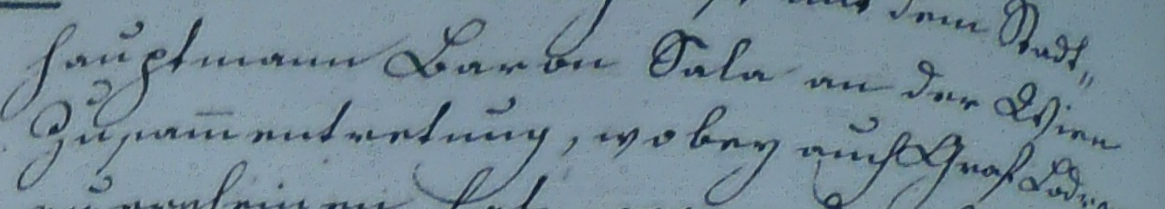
hauptmann Baron Sala an der Wien
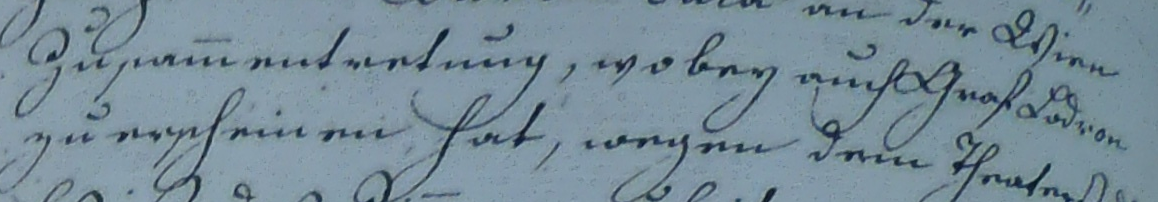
Zusam̅entretung, wobey auch Graf Lodron
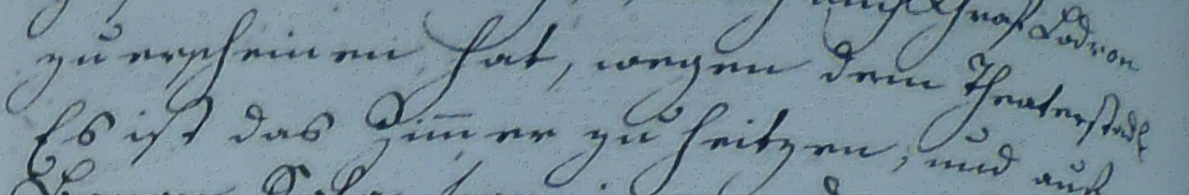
zu erscheinen hat, wegen dem Theaterstadl.
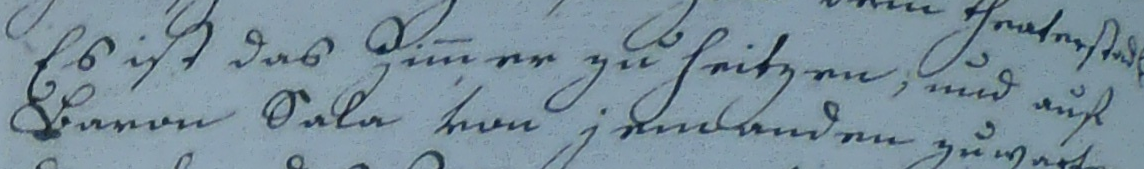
Es ist das Zim̅er zu heitzen, und auf
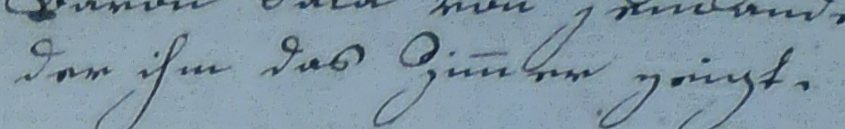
der ihm das Zim̅er zeigt.
